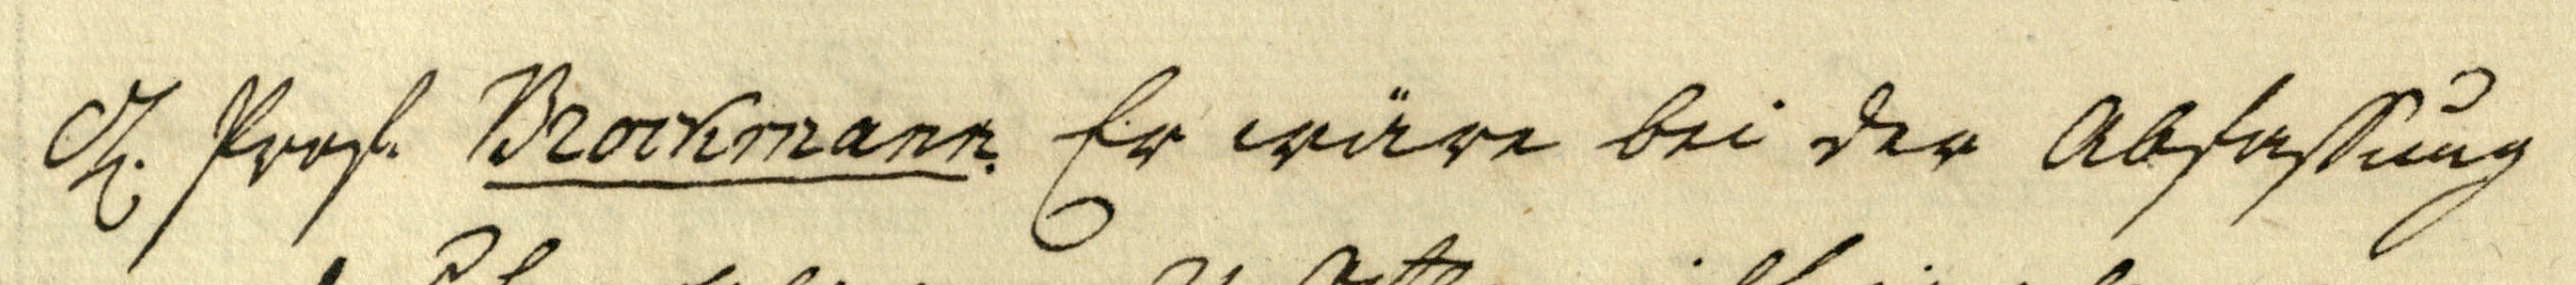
dh. Prof. Brockmann. Er wäre bei der Abfassung
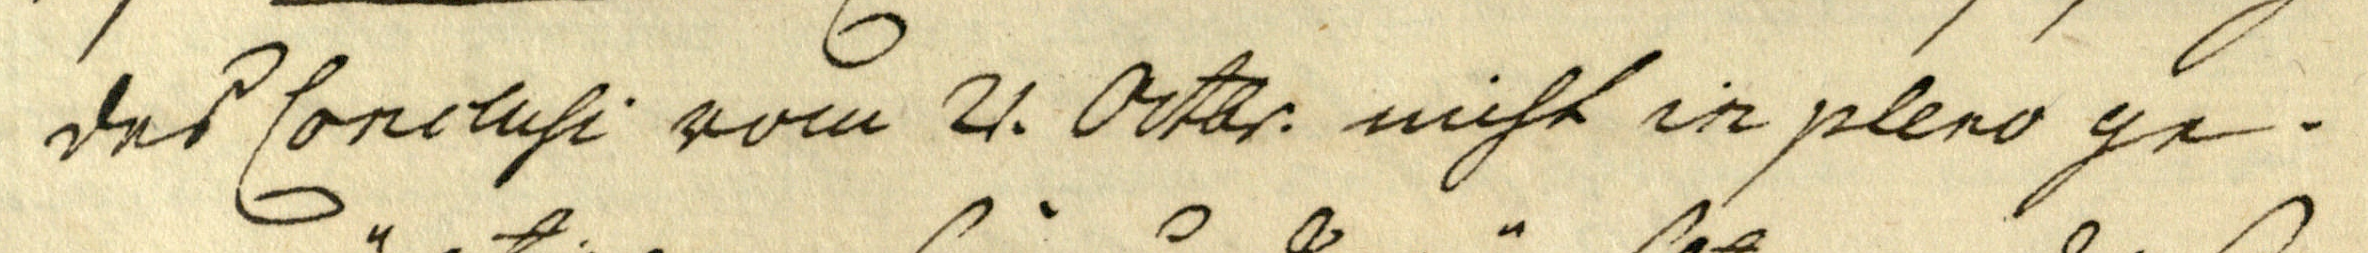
des Conclusi vom 21. Octbr. nicht in pleno ge¬
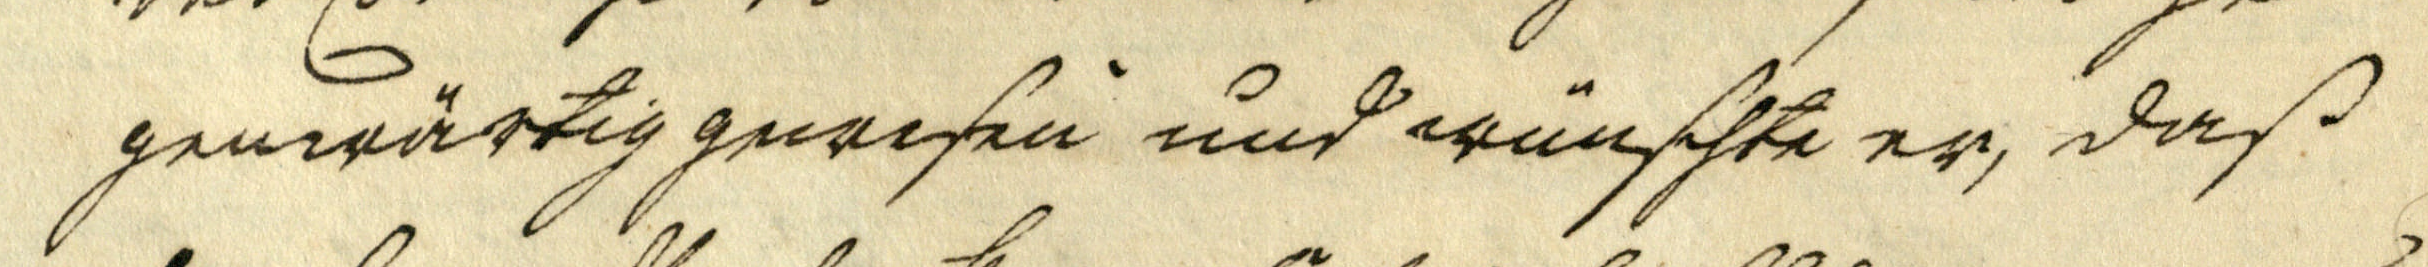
genwärtig gewesen und wünschte er, daß
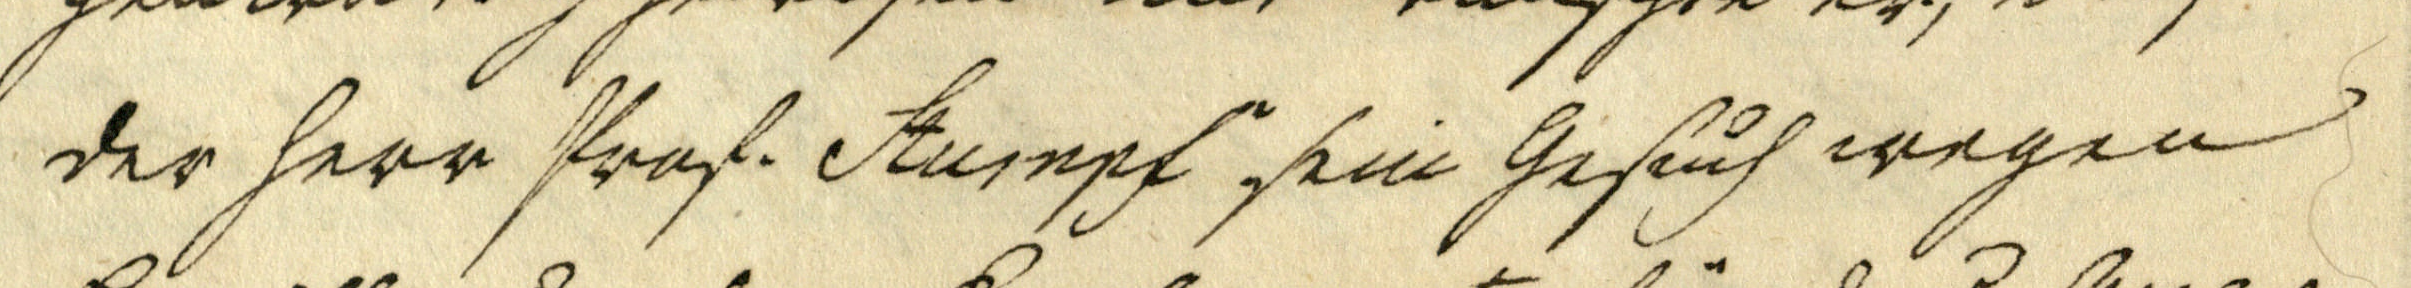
der Herr Prof. Stumpf sein Gesuch wegen
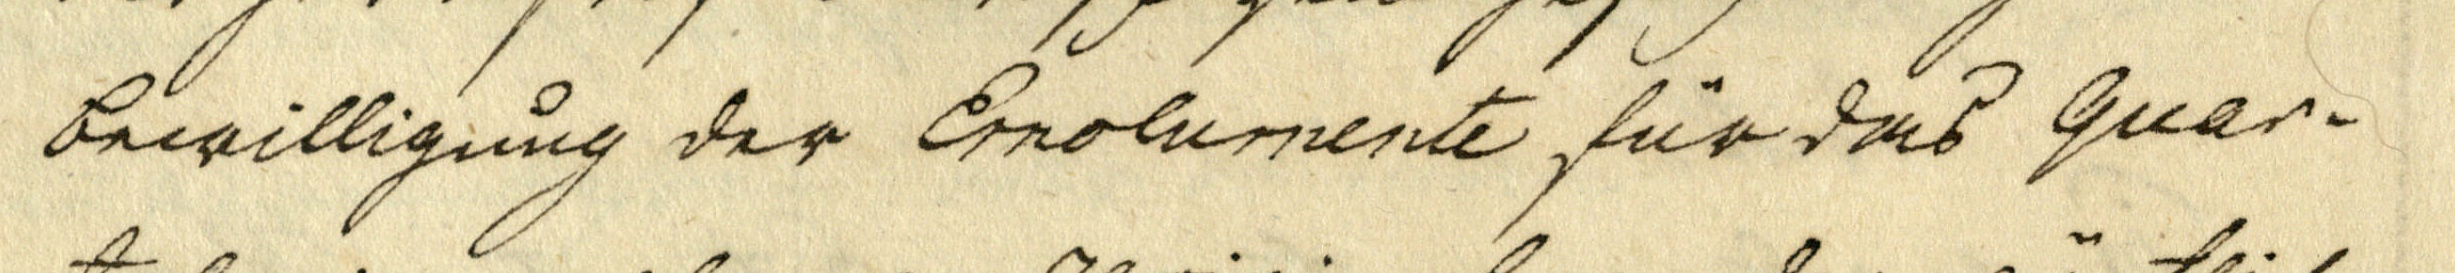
Bewilligung der Emolumente für das Quar¬
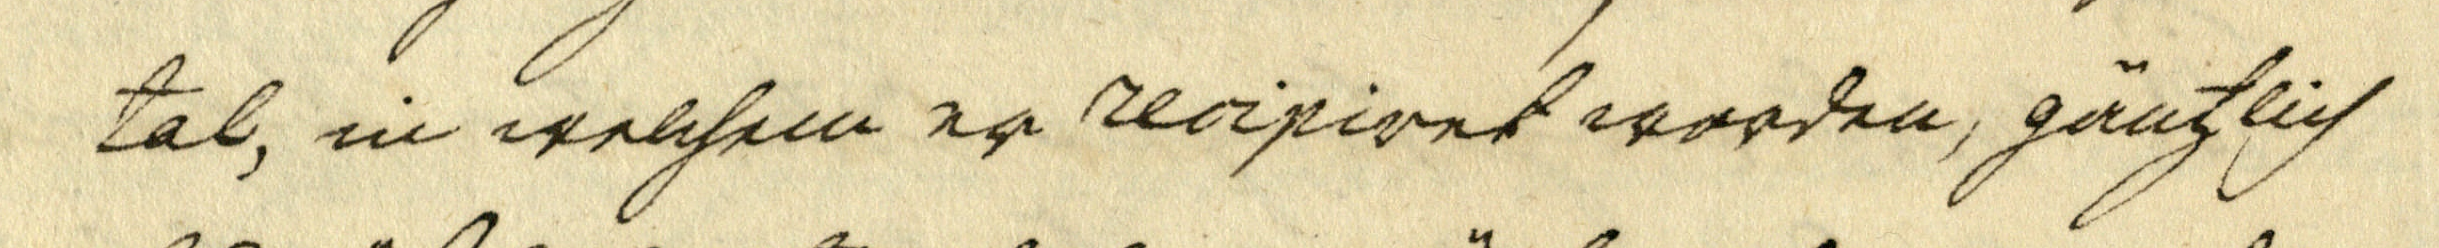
tal, in welchem er recipiret worden, gäntzlich
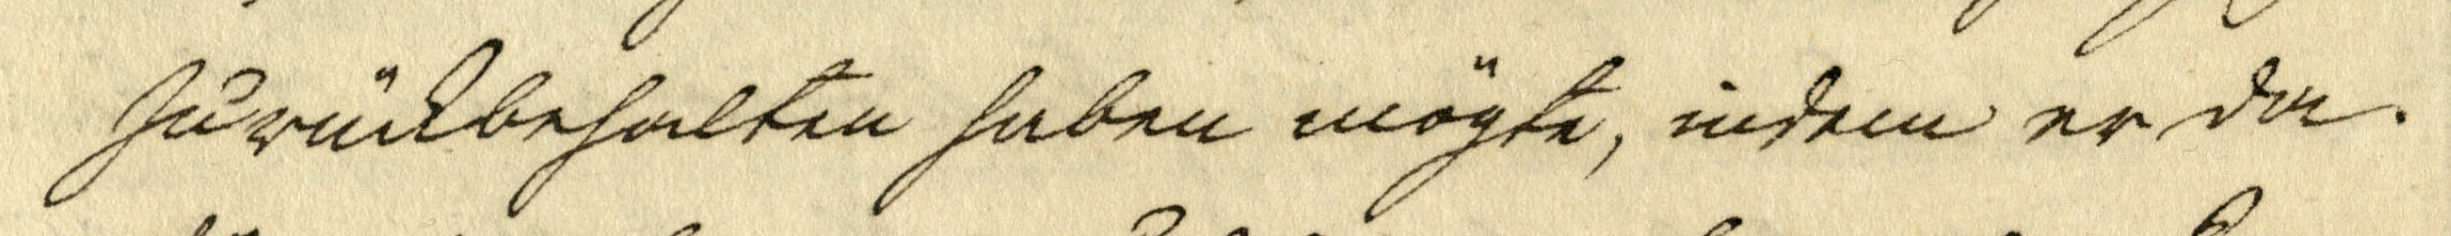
zurückbehalten haben mögte, indem er da¬
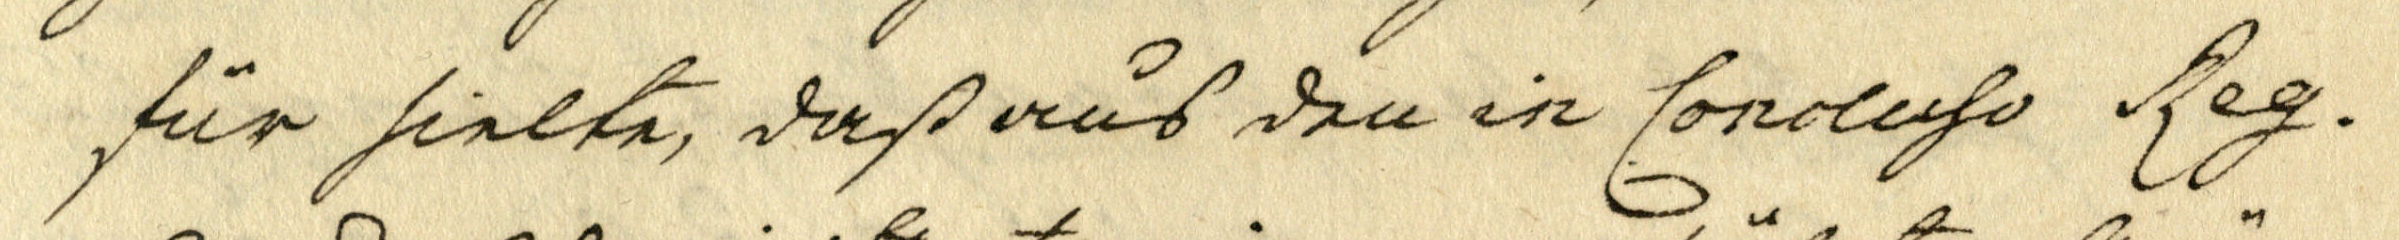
für hielte, daß aus den in Concluso Reg.
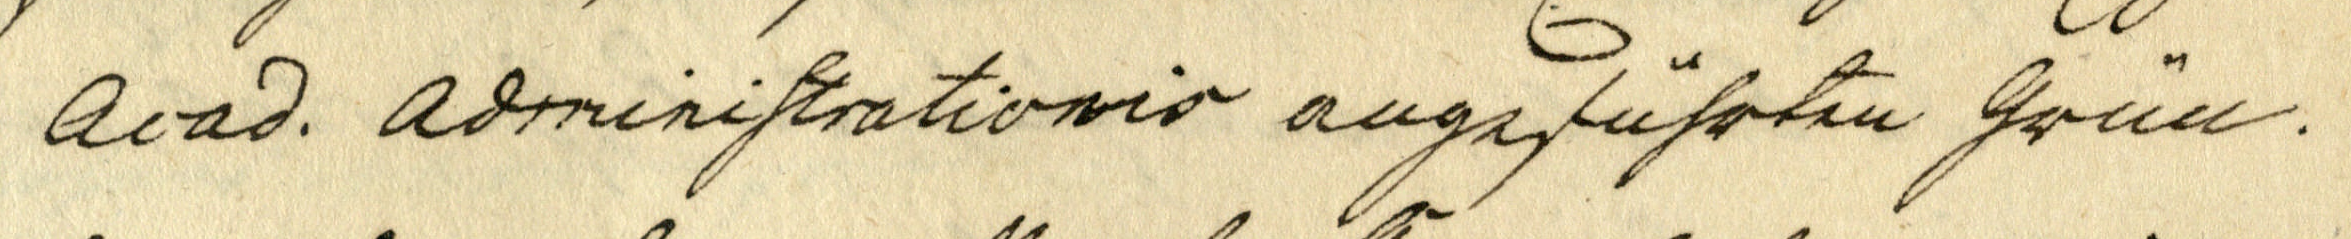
Acad. Administrationis angeführten Grün¬
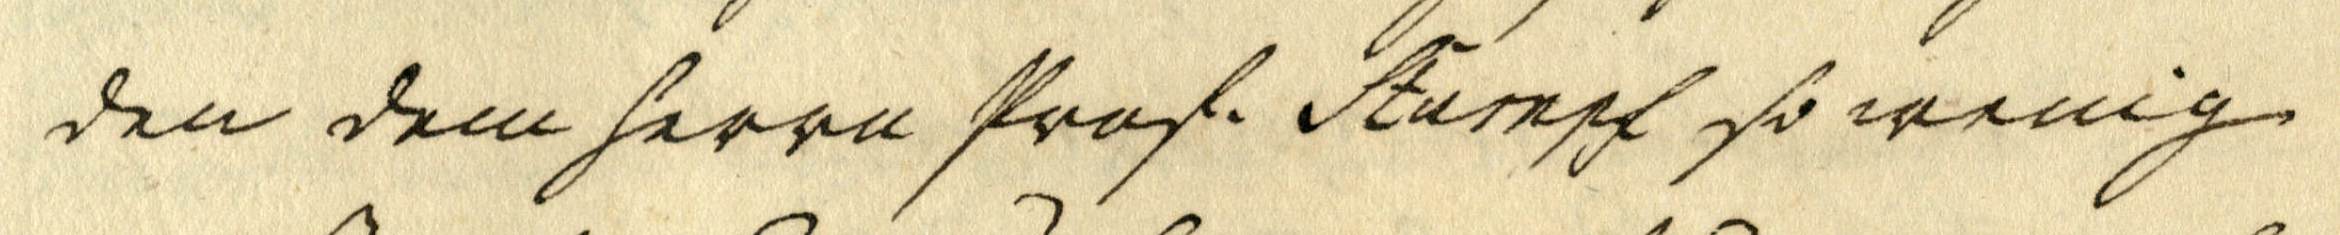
den dem Herrn Prof. Stumpf so wenig
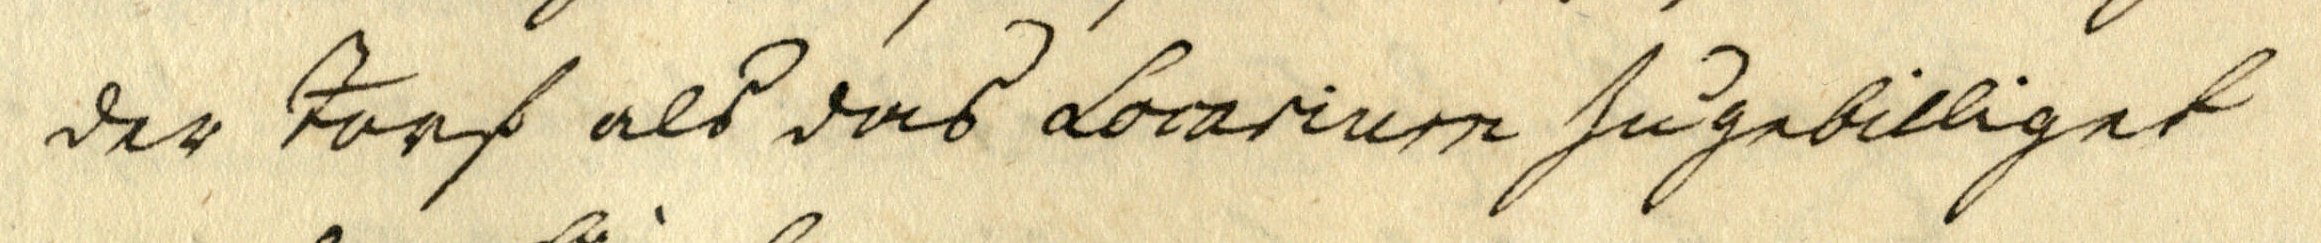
der Torf als das Locarium zugebilliget
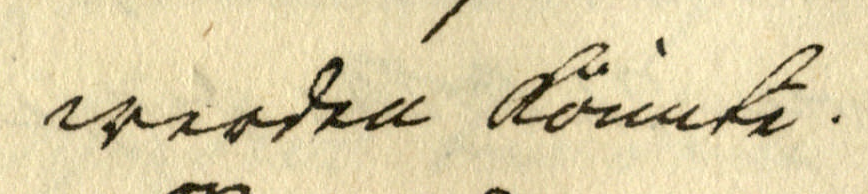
werden könnte.
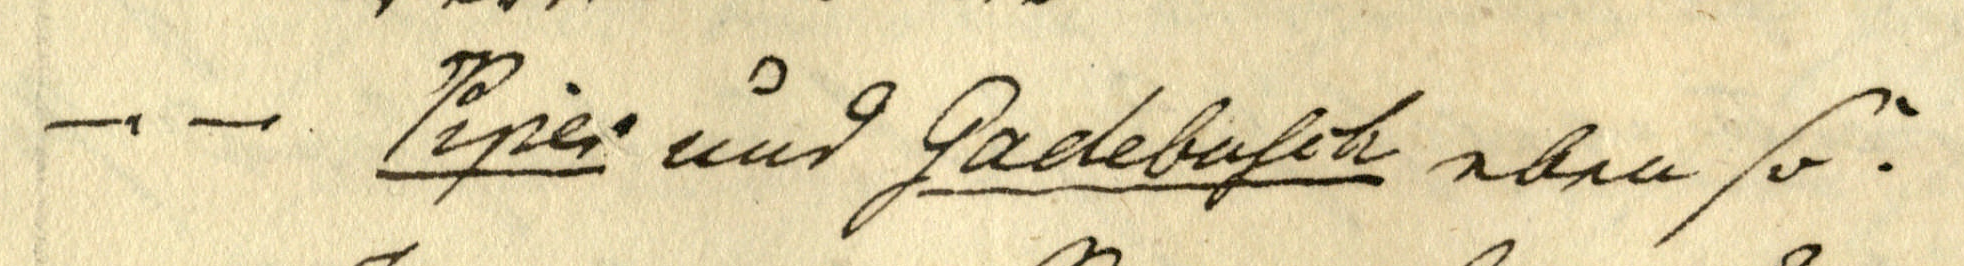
Piper und Gadebusch eben so.
